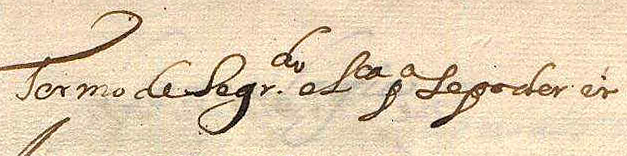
Termo de Segr.do e Lca pa se poder ir
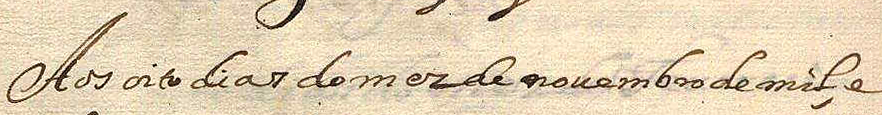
Aos oito dias do mez de nouembro de mil, e
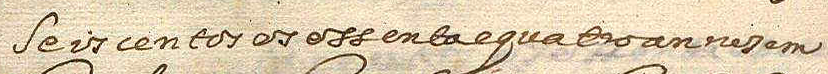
seiscentos e sessenta e quatro annos em
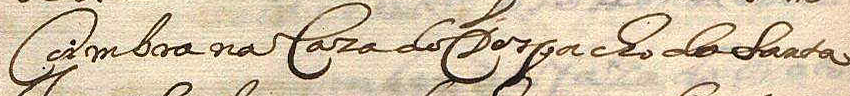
Coimbra na Caza do Despacho da Santa
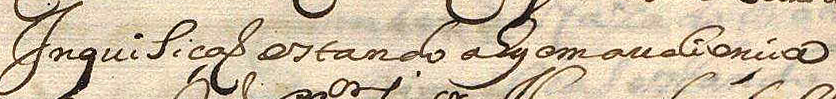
Jnquisiçaõ estando ahy em audiencia
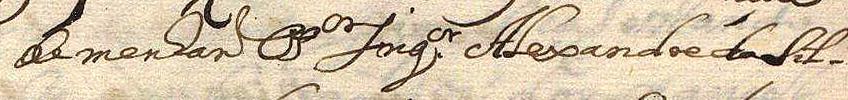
de menham O Sor Jnq.or Alexandre da Sil
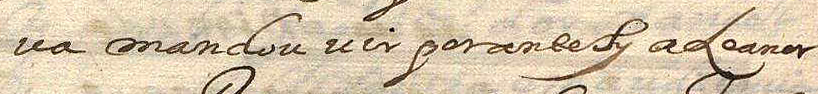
ua mandou uir perante sy a Leanor
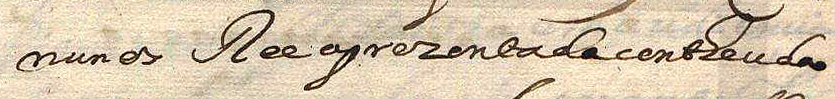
nunes Ree aprezentada contheuda
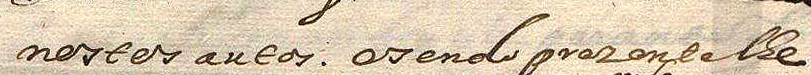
nestes autos; e sendo prezente lhe
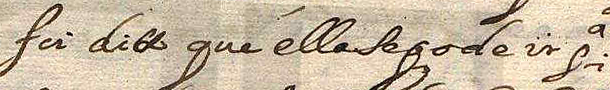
foi ditto que ella se pode ir p.a
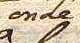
onde
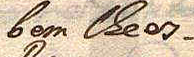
bem lhe es
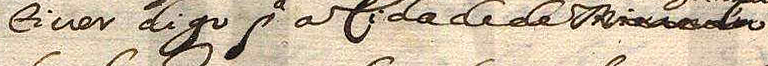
tiuer digo p.a a Cidade de Miranda
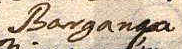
Bargança
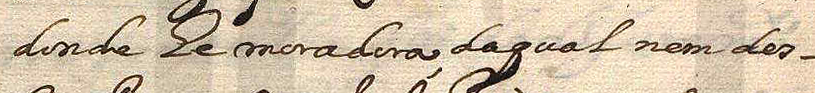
donde he moradora, da qual nem des
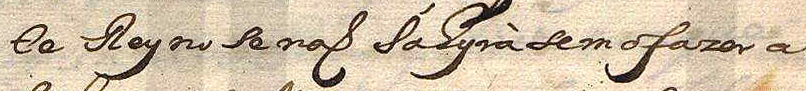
te Reyno se naõ sahyrà sem o fazer a
